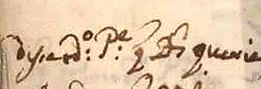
disse o d.o P.e q̄ Ds̄ queria
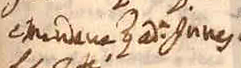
e mandaua q̄ a d.a Jnnes
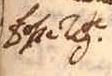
fosse Reg.te
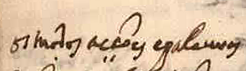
os modos acções e palauras
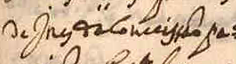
de Jnes da Conceissaõ pa
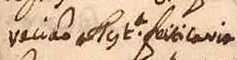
reciaõ a Test.a feitiçaria
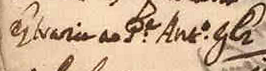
e q̄ trazia ao P.e Ant.o Glz̄
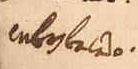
enbasbacado.
